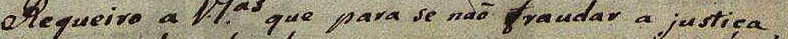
Requeiro a V.I.as que para se naõ fraudar a justiça,
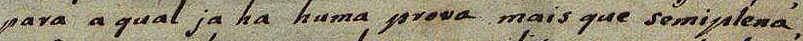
para a qual ja ha huma prova mais que semiplena,
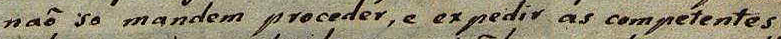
naõ se mandem proceder, e expedir as competentes
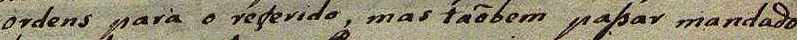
ordens para o referido, mas taõbem passar mandado
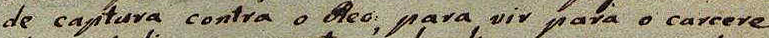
de captura contra o Reo, para vir para o carcere
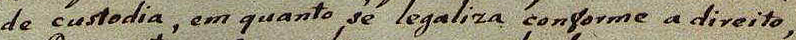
de custodia, em quanto se legaliza conforme a direito,
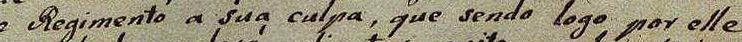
e Regimento a sua culpa, que sendo logo por elle
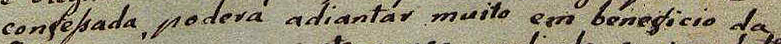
confessada, poderá adiantar muito em beneficio da
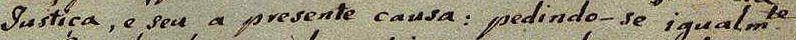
Iustiça, e seu a presente causa: pedindo-se igualm.te
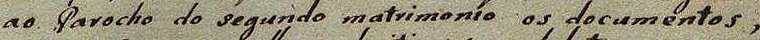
ao Parocho do segundo matrimonio os documentos,
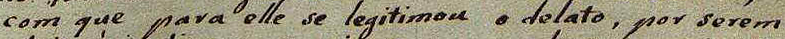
com que para elle se legitimou o delato, por serem
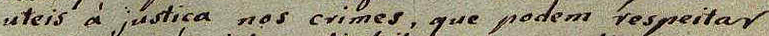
uteis à justiça nos crimes, que podem respeitar
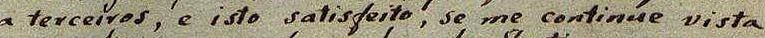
a terceiros, e isto satisfeito, se me continue vista
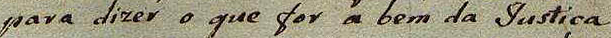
para dizer o que for a bem da Iustiça
